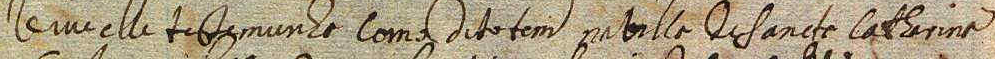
Viue elle testemunha como dito tem na villa de sancta Catherina
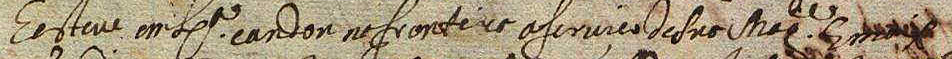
E esteue em Lxa. e andou na fronteira a seruiço de sua Mag.de E mais
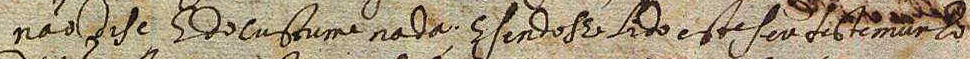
não dise E do custume nada. E sendolhe lido este seu testemunho
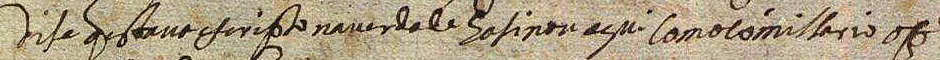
dise q̄ estaua escripto na uerdade E asinou aqui com o com̄issario o pe.
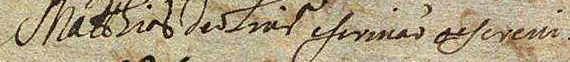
Matthias de oLiura escriuaõ o escreui.
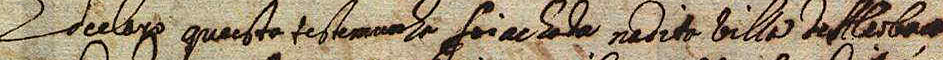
E declaro que esta testemunha foi achada na dita villa de Alcobaça
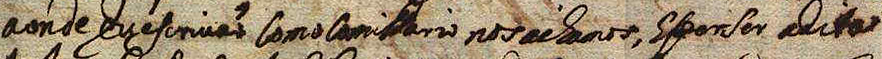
aonde eu escriuaõ com o comissario nos achamos, E por ser a dita
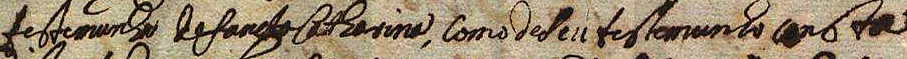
testemunha de sancta Catherina, como de seu testemunho consta
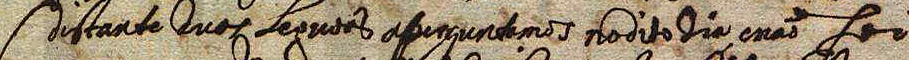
distante duas leguoas, o perguntamos no dito dia, e naõ foi
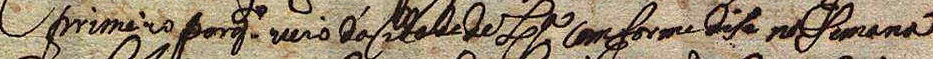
primeiro porq.to ueio da Cidade de Lx.a comforme dise na semana
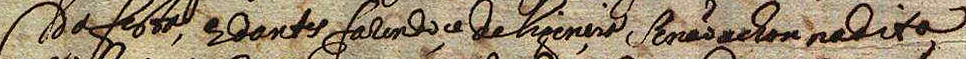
da festa, E dantes fazendoçe deligençia Se naõ achou na dita
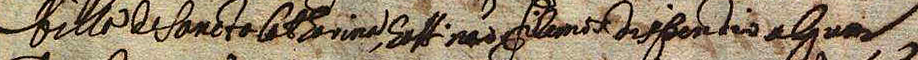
Villa de Sancta Catherina, E assi não fizemos dispendio algum,
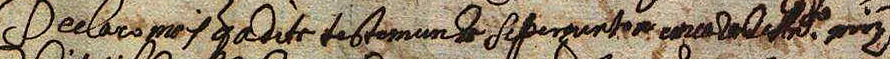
Declaro mais q̄ a dita testemunha se perguntou em caza de An.to miz̄
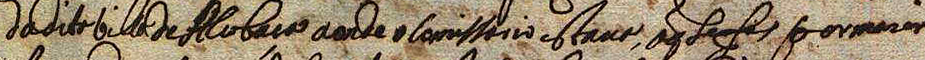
da dita villa de Alcobaça aonde o comissario estaua, o q̄ se fez por maior
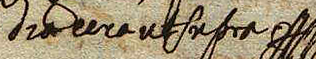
dia e era ut supra
